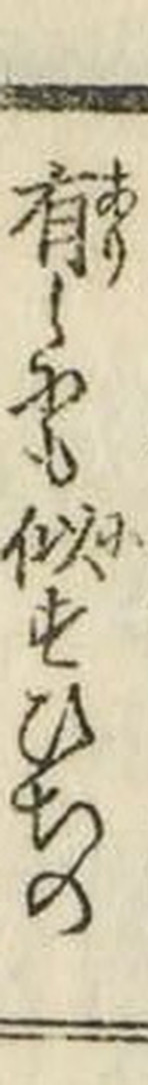有しにも似すひちの
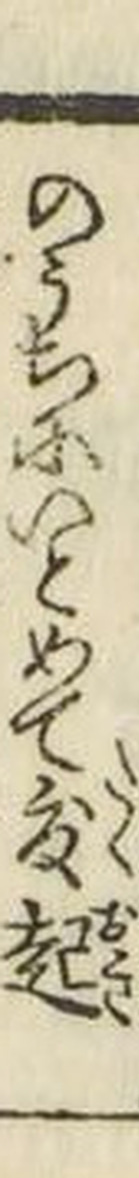のうちにいとめて度起
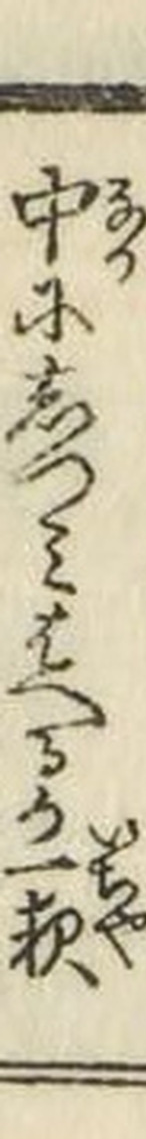中にしつみはへるか一夜
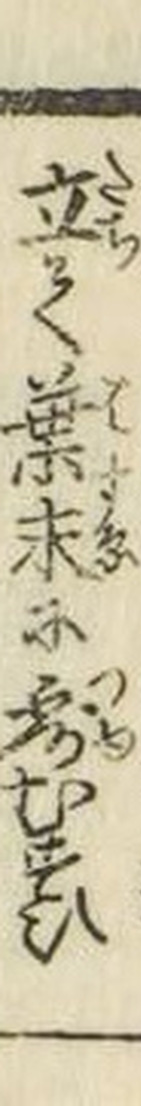立て葉末に露むすひ
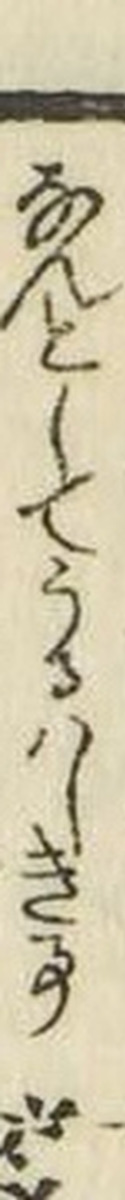なんとしてうるはしき事
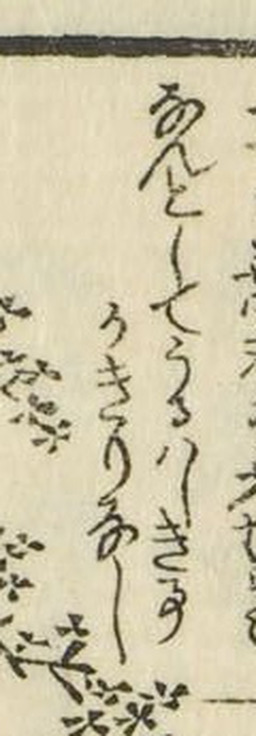かきりなし
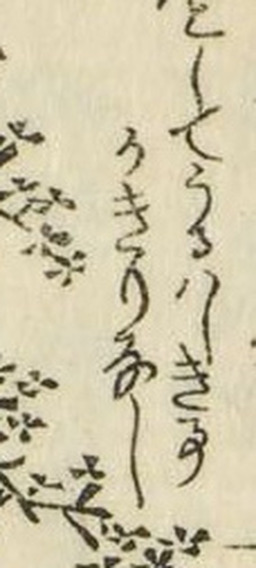かきりなし

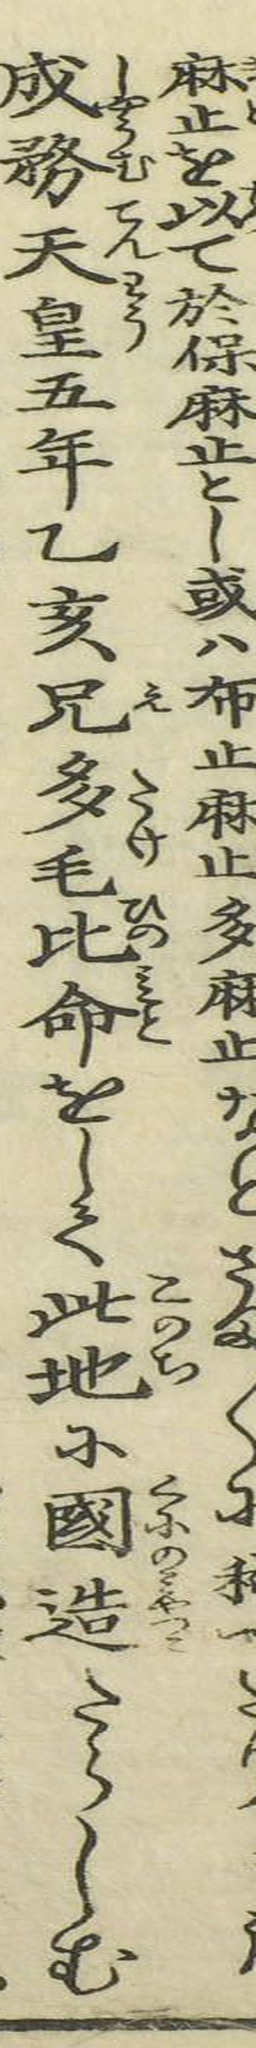成務天皇五年乙亥兄多毛比命をして此地に国造たらしむ
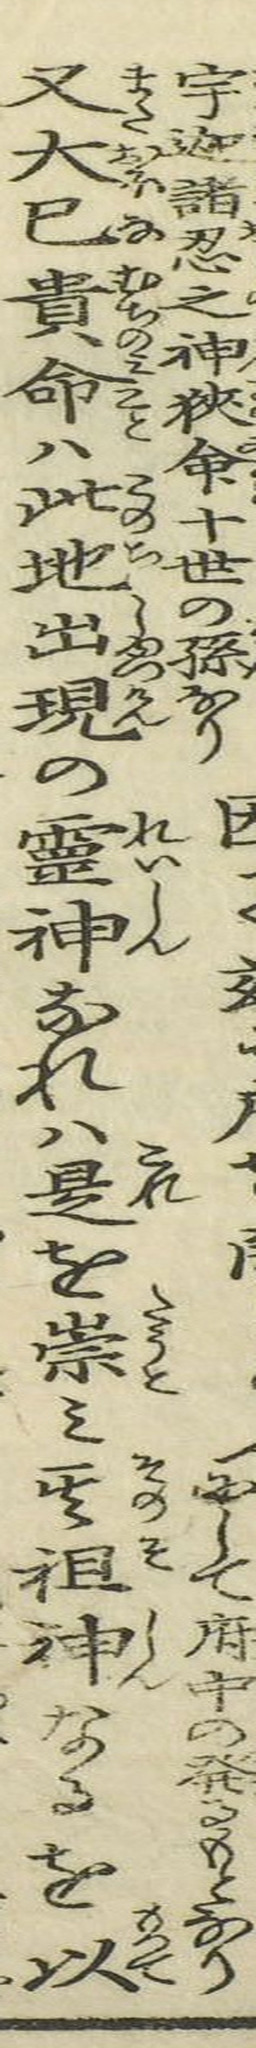又大巳貴命は此地出現の霊神なれは是を崇み其祖神なるを以
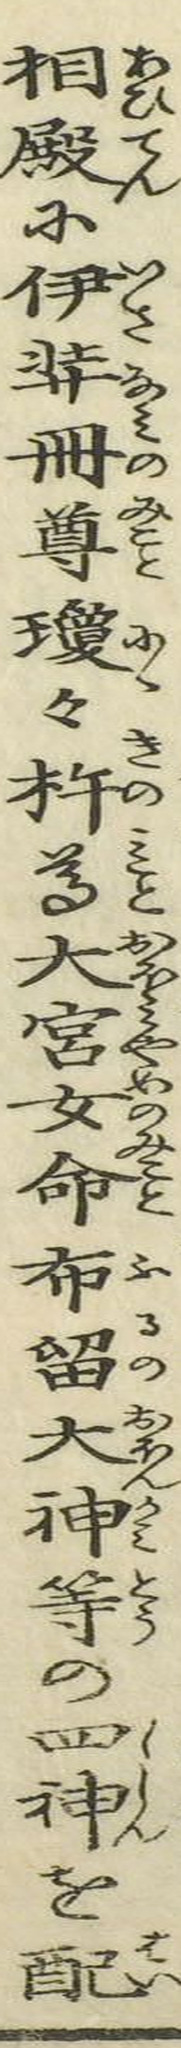相殿に伊弉冊尊瓊々杵尊大宮女命布留大神等の四神を配
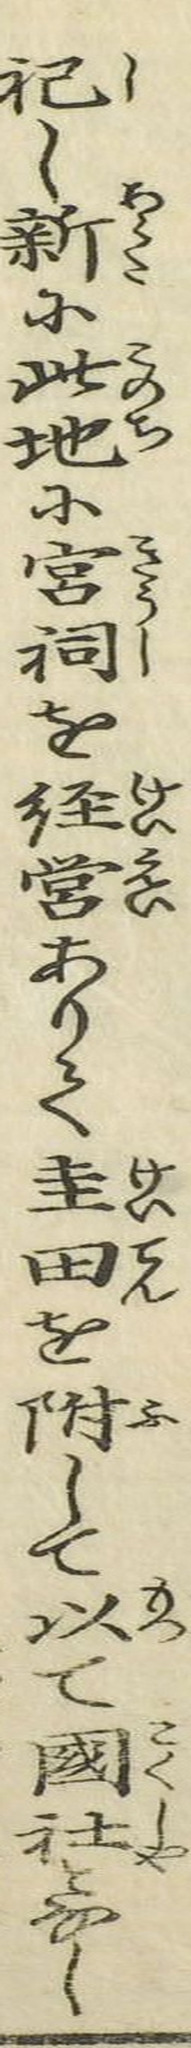祀し新に此地に宮祠を経営ありて圭田を附して以て国社となし
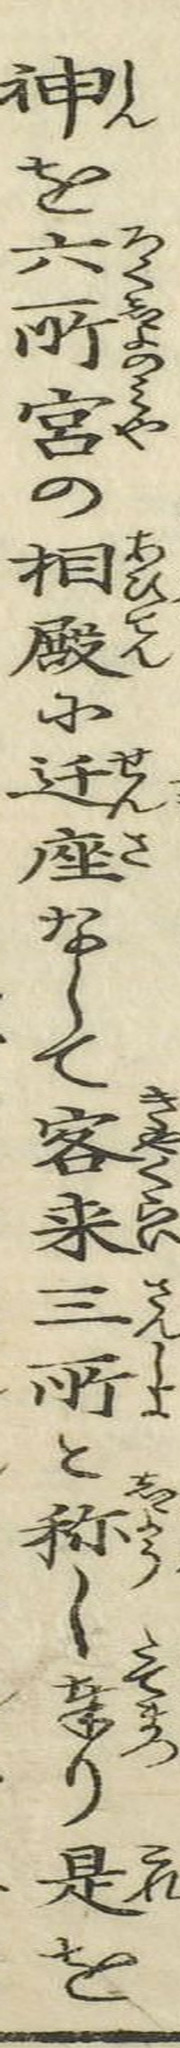神を六所宮の相殿に遷座なして客来三所と称し奉り是を
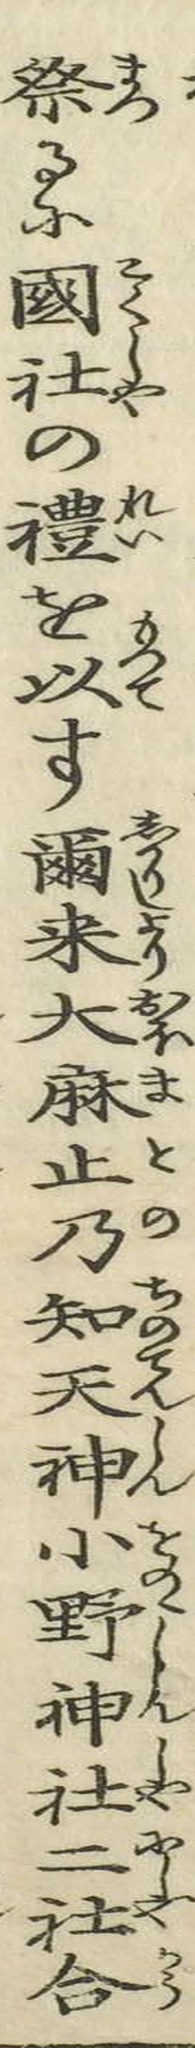祭るに国社の礼を以す爾来大麻止乃知天神小野神社二社合
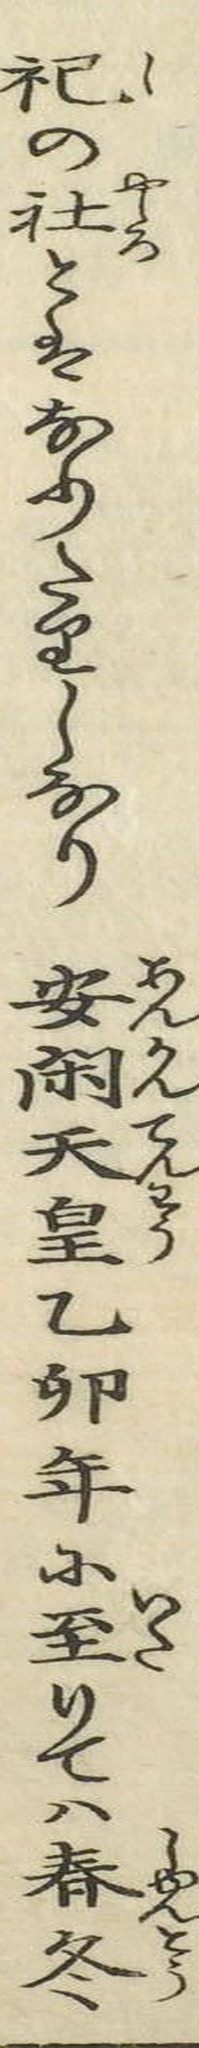祀の社とはなりたりしなり安閑天皇乙卯年に至りては春冬
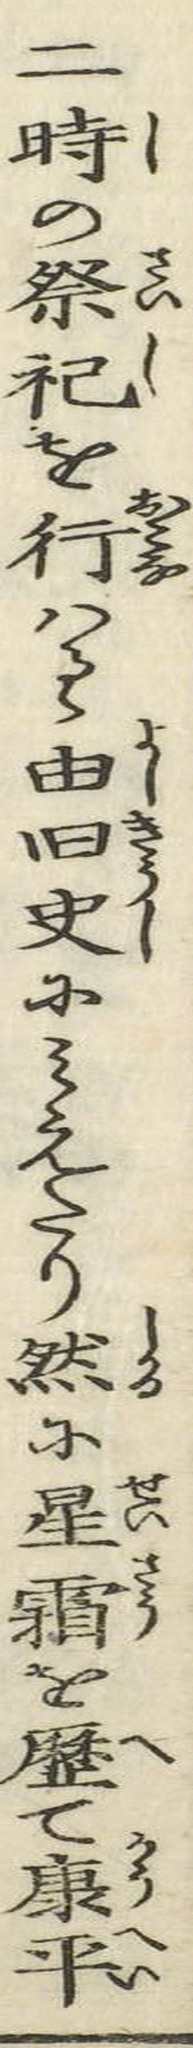二時の祭祀を行はるる由旧史にみえたり然に星霜を歴て康平
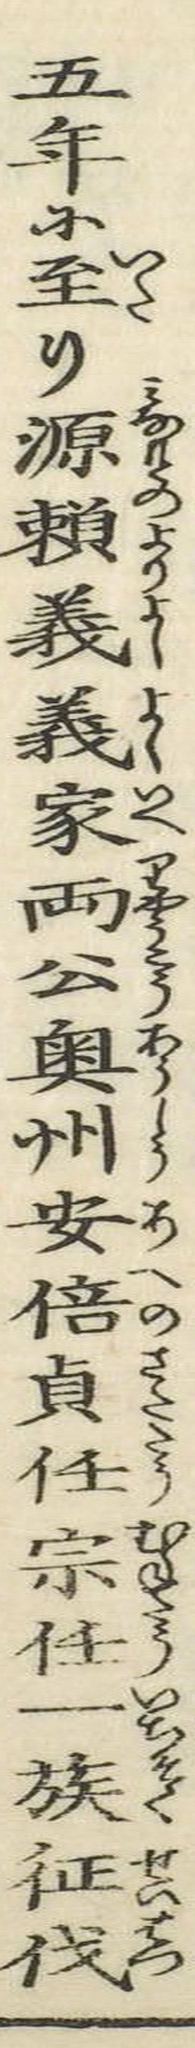五年に至り源頼義義家両公奥州安倍貞任宗任一族征伐
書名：江戸名所図会 20巻 巻之10
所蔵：東京学芸大学教育コンテンツアーカイブ
